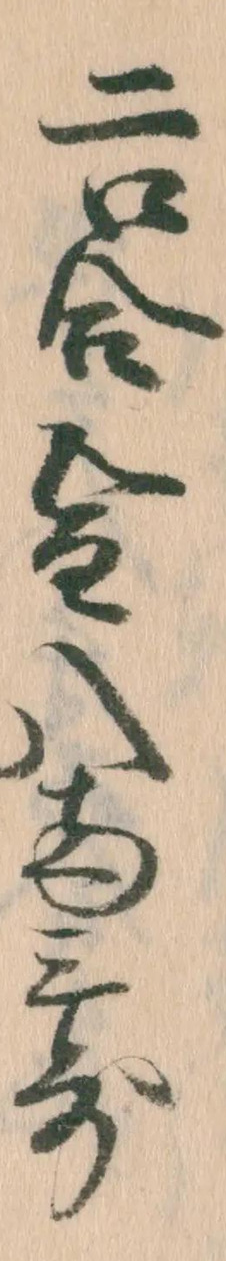二口合金八両三分
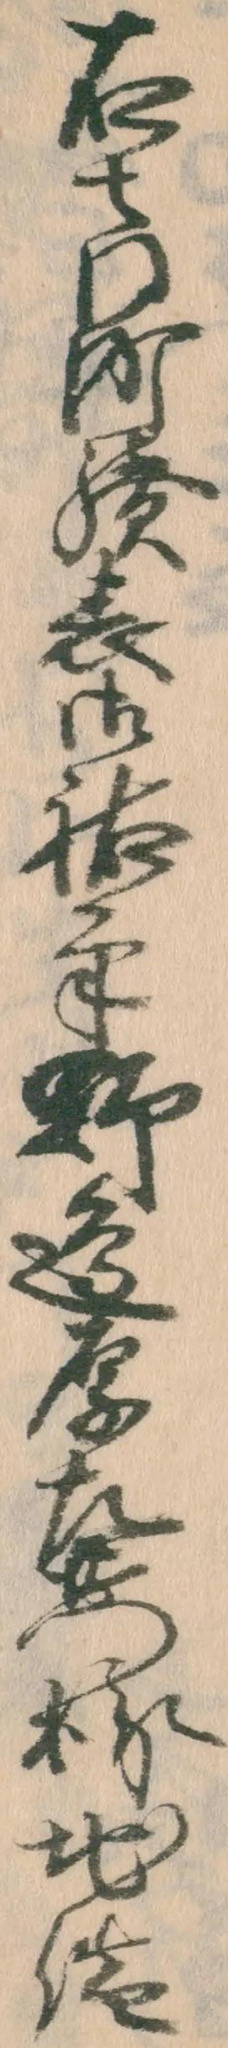右は同町続表御祐筆野辺厚左衛門様地借
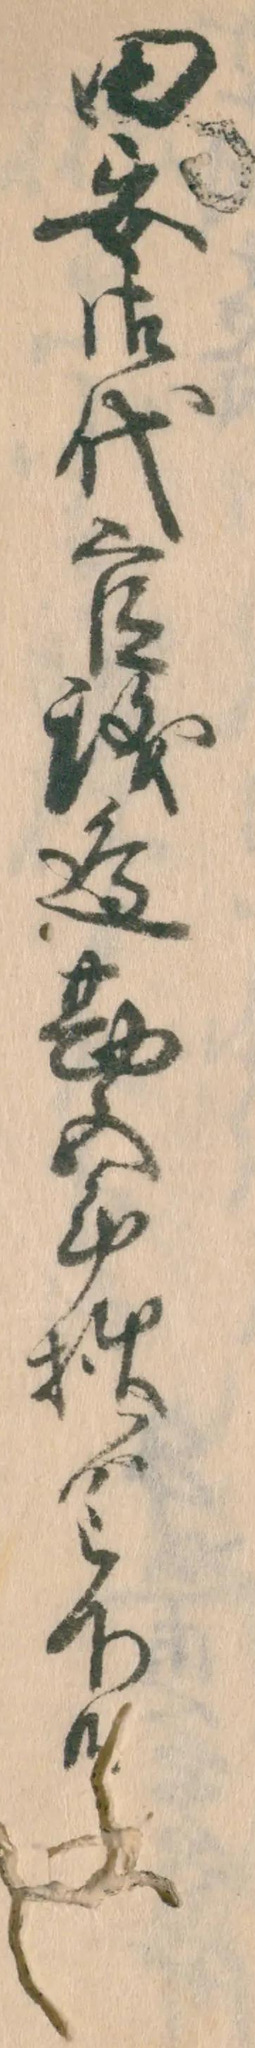田安御代官磯辺勘五郎様ゟ被下候

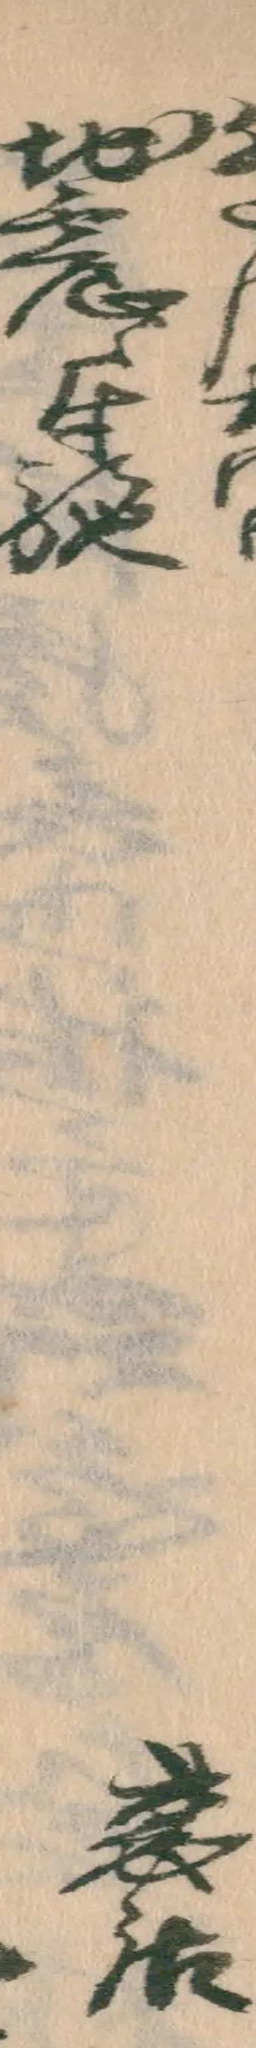地震ニ付施裏店
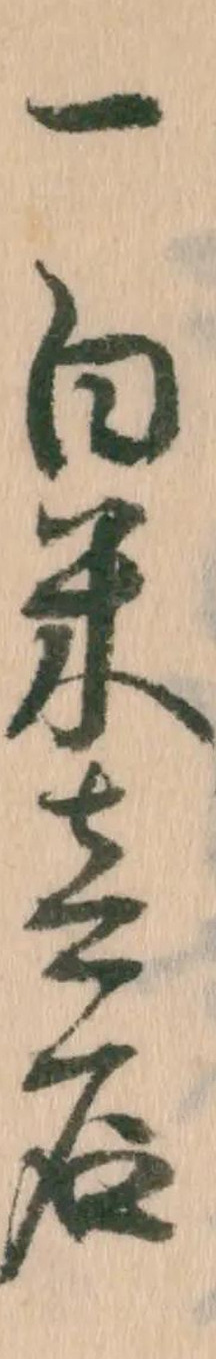一白米壱石七拾五軒
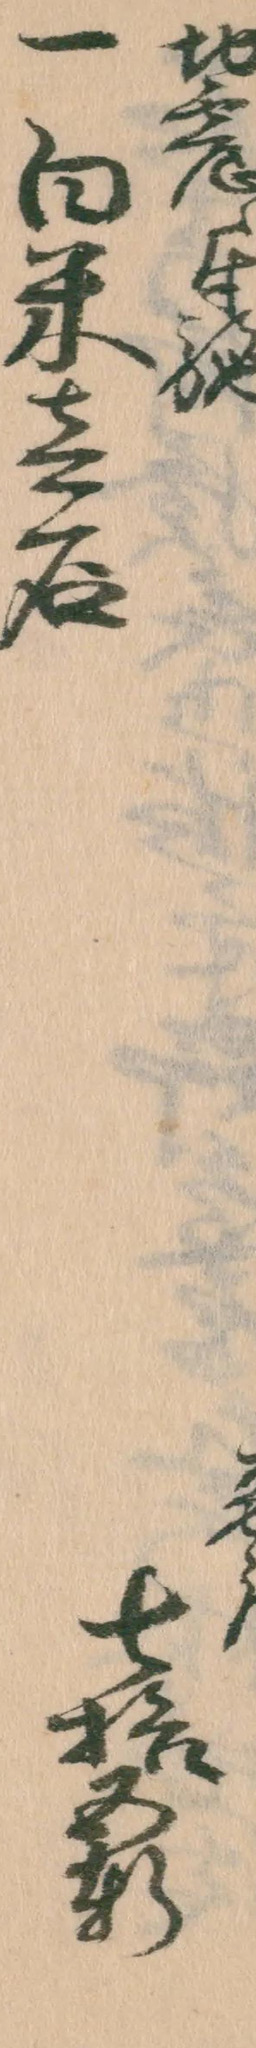一白米壱石七拾五軒
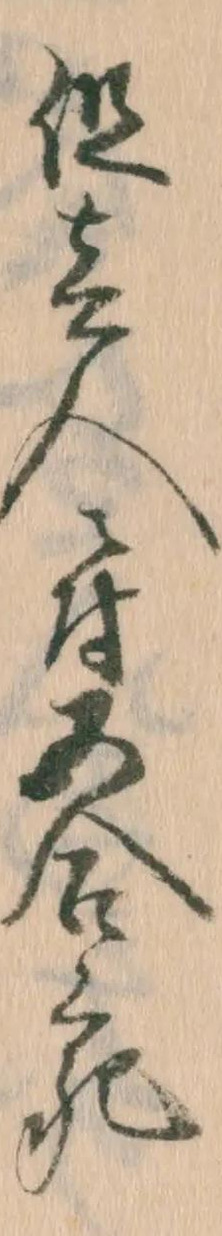但壱人ニ付五合宛
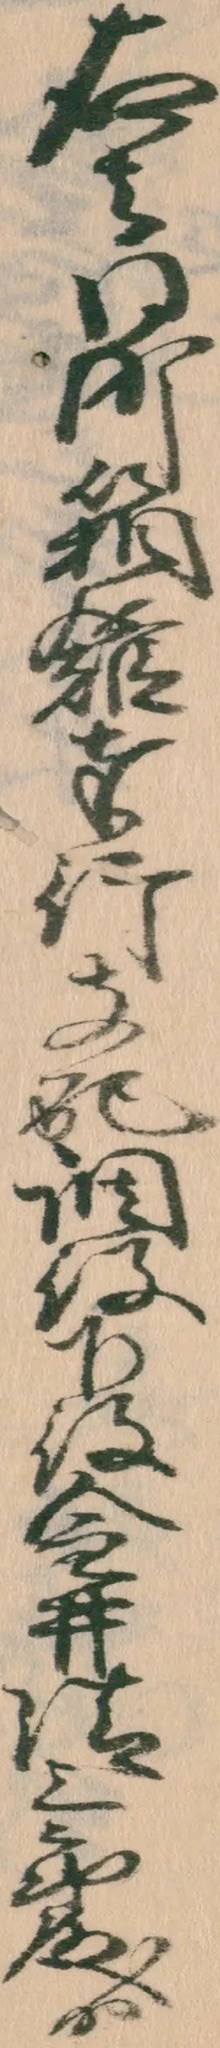右は同町箱館奉行支配調役下役金井清三郎殿ゟ
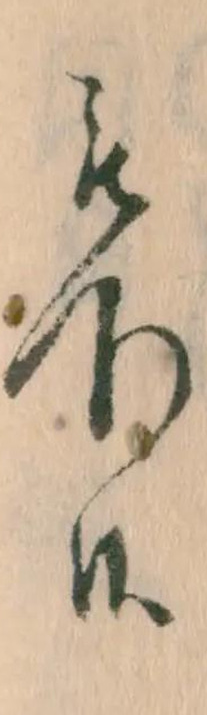被下候
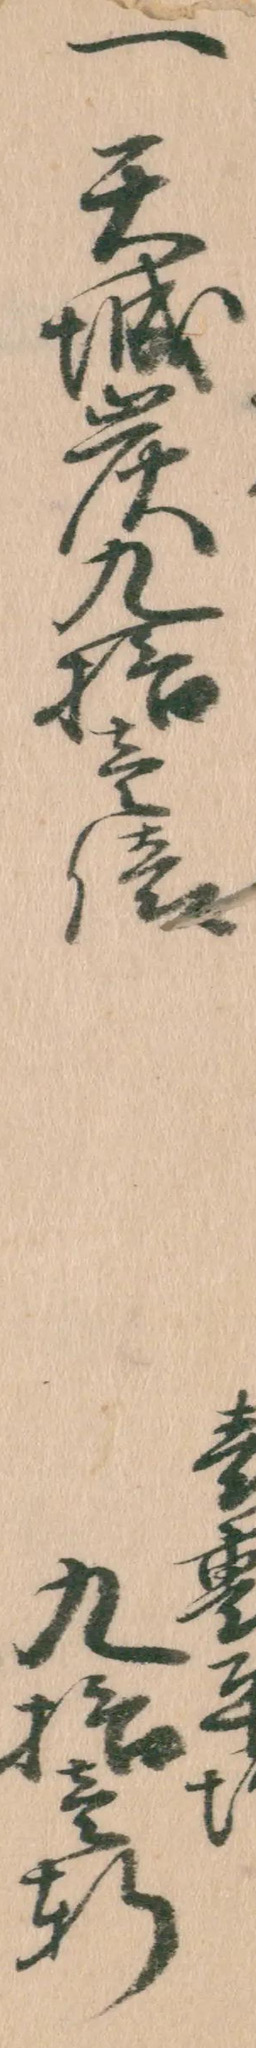一天城炭九拾壱俵九拾壱軒
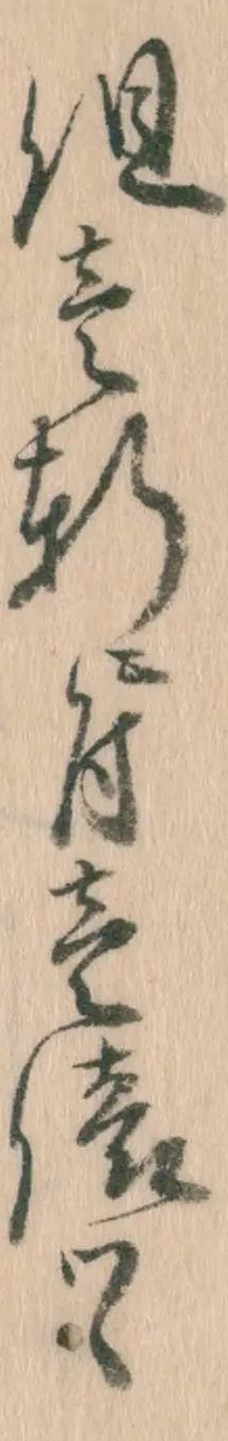但壱軒ニ付壱俵ツヽ
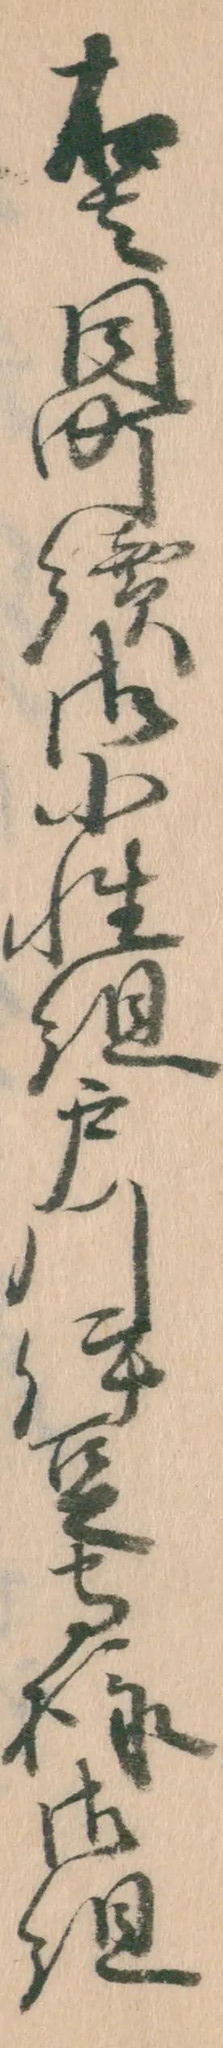右は同町続御小性組戸川伊豆守様御組
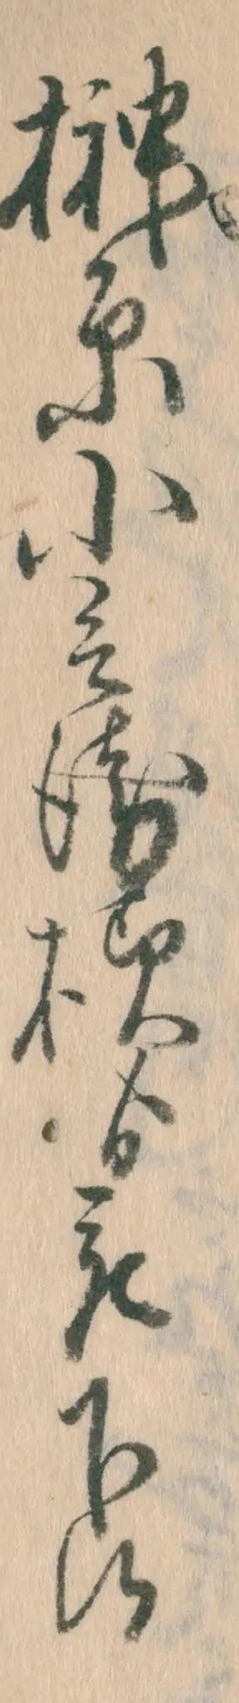榊原小兵衛様ゟ被下候

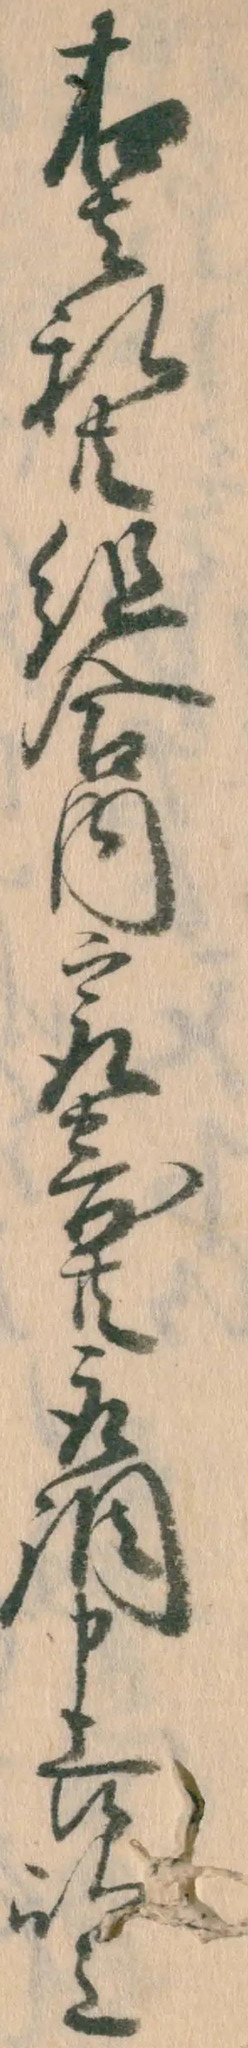右は私共組合内最寄共取調申上候以上
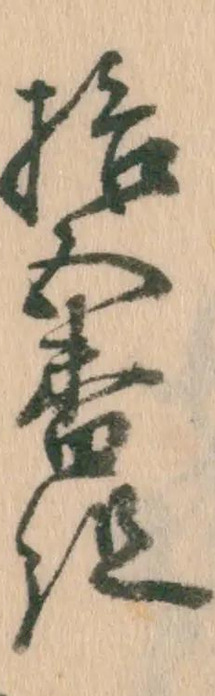拾五番組
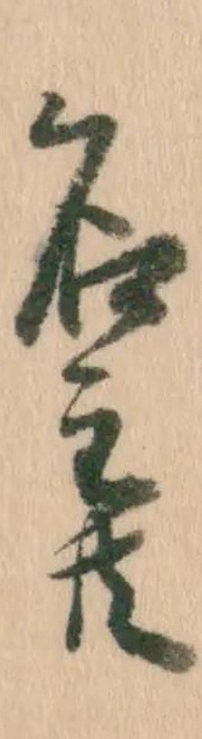名主共
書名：武家方并寺院等ニテ施差出候一件
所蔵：国立国会図書館 National Diet Library, JAPAN
